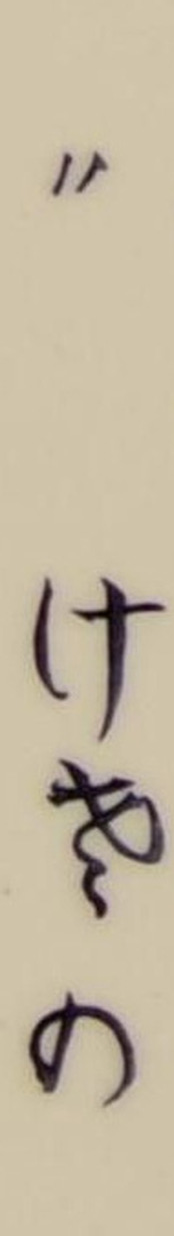けさの
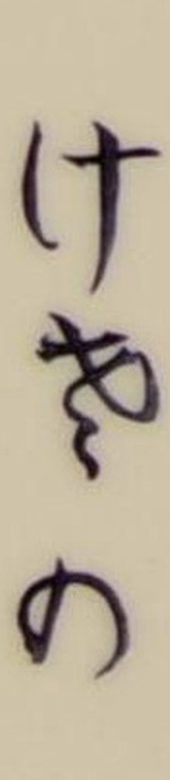けさの
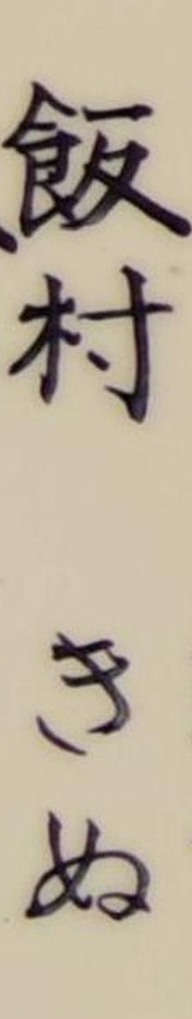飯村きぬ
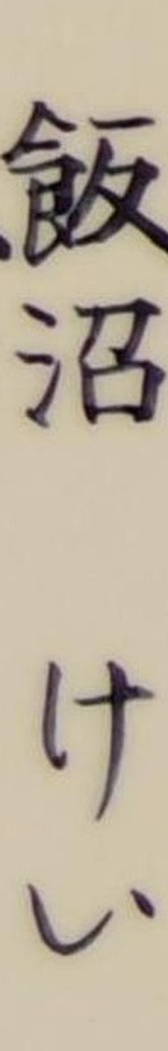飯沼けい
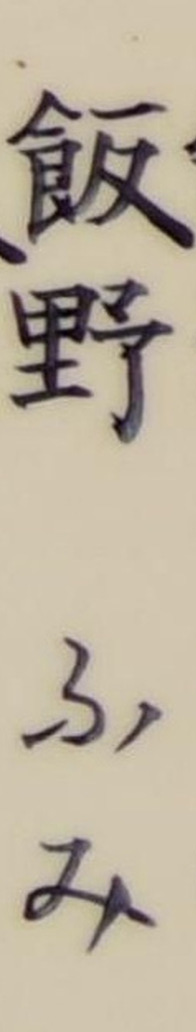飯野ふみ
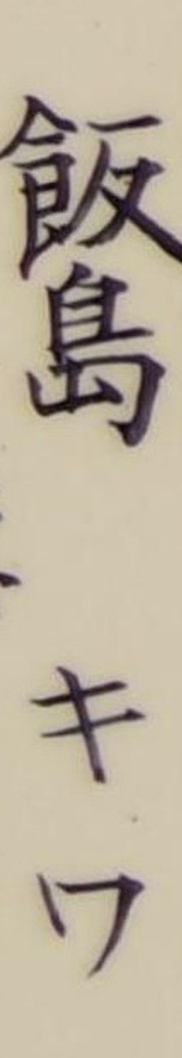飯島キワ
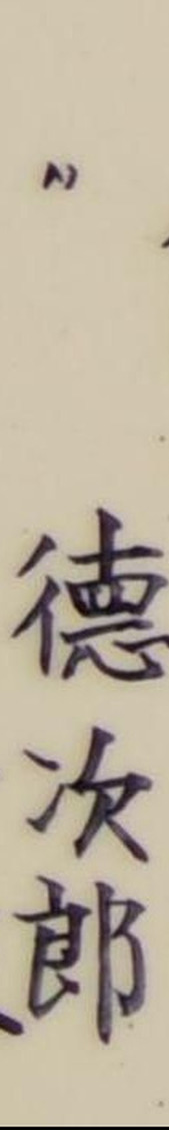徳次郎
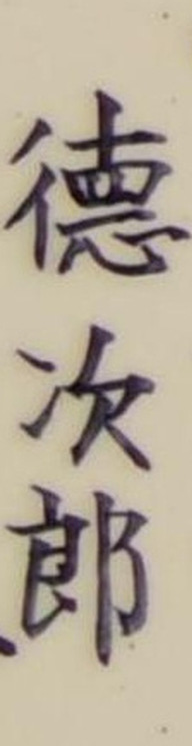徳次郎
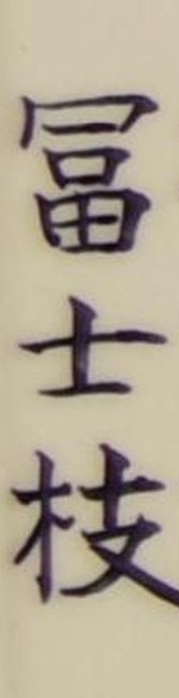冨士枝

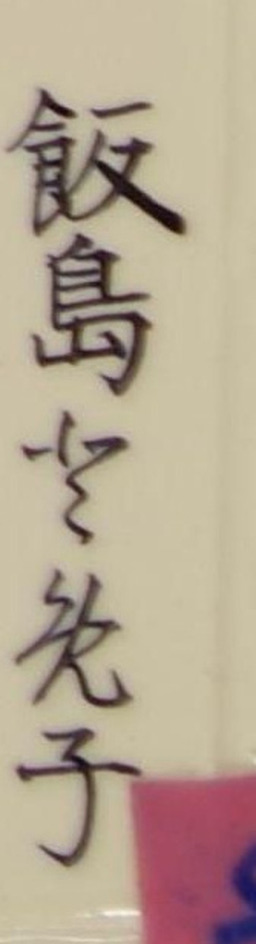飯島とめ子
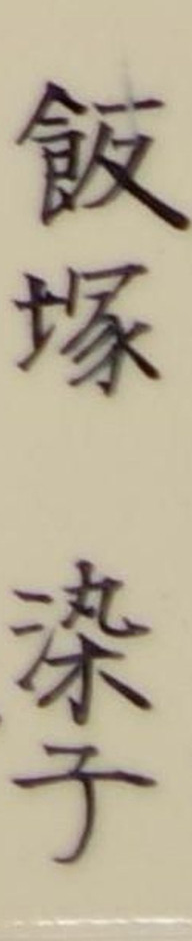飯塚染子
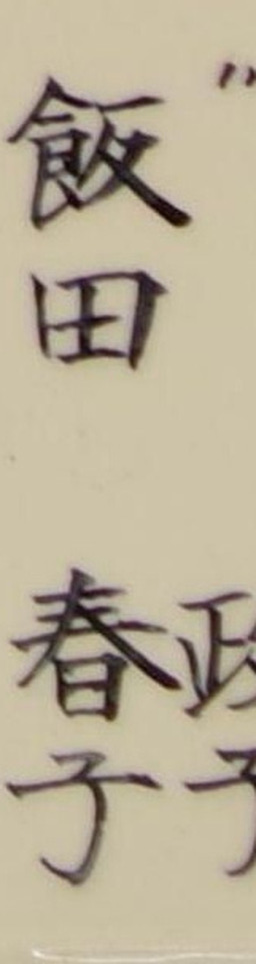飯田春子
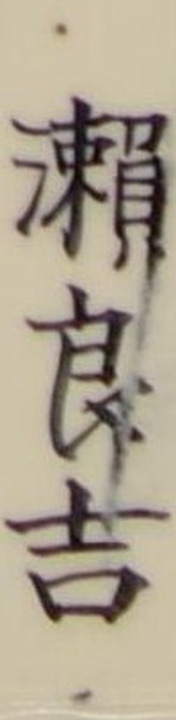瀬良吉
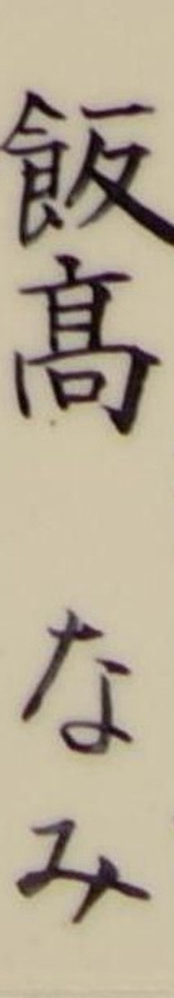飯高なみ
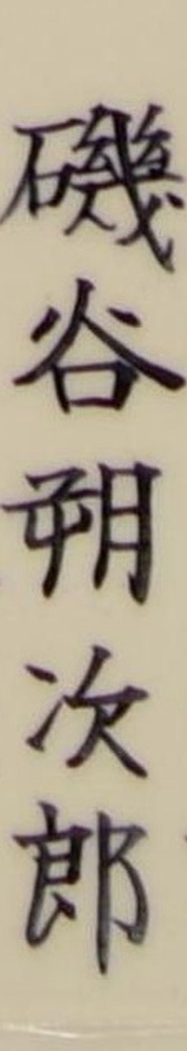磯谷朔次郎
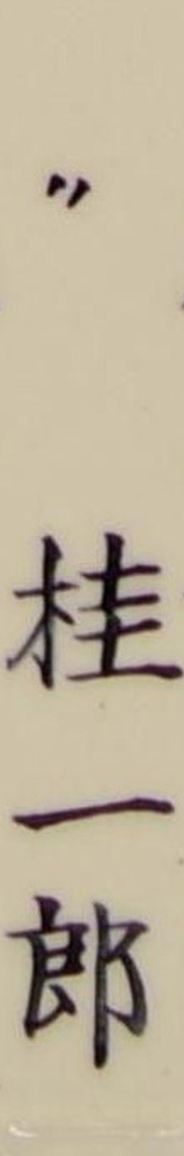桂一郎
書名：E~L
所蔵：高野山金剛峯寺
